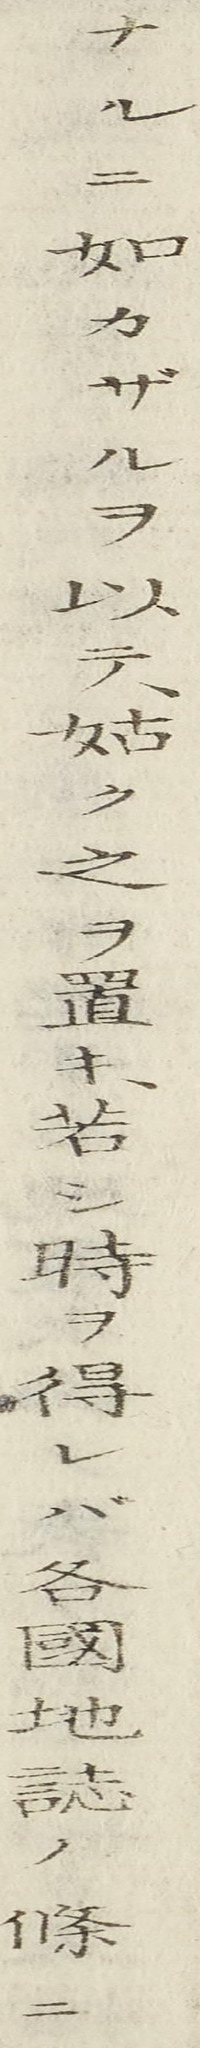ナルニ如カザルヲ以テ、姑ク之ヲ置キ、若シ時ヲ得レバ各国地誌ノ条ニ
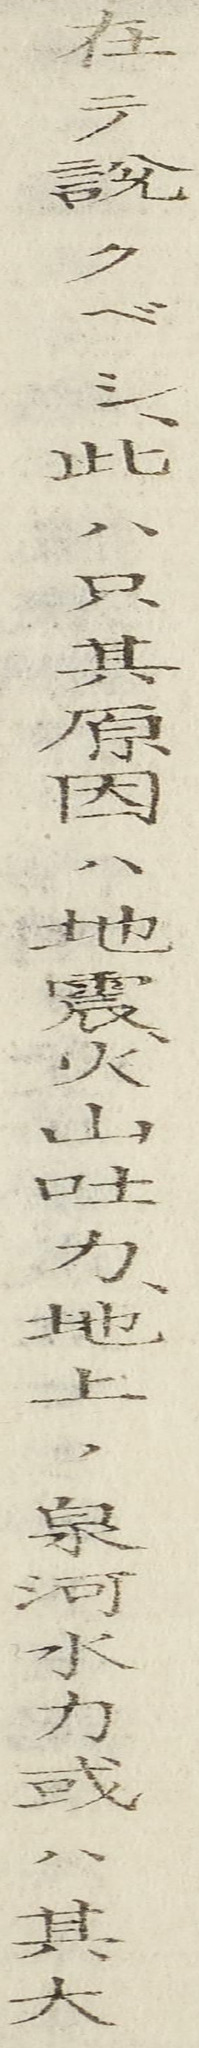在テ説クベシ、此ハ只其原因ハ地震火山吐力、地上ノ泉河水力或ハ其大

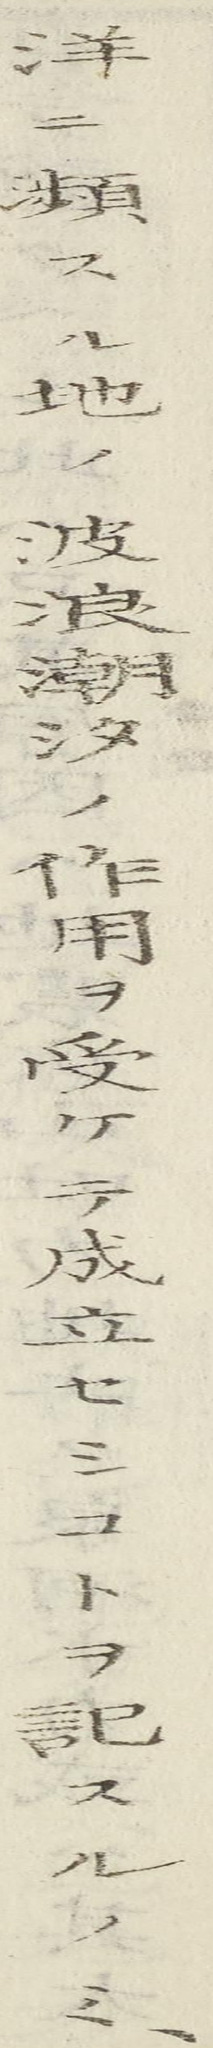洋ニ瀕スル地ノ波浪潮汐ノ作用ヲ受ケテ成立セシコトヲ記スルノミ、
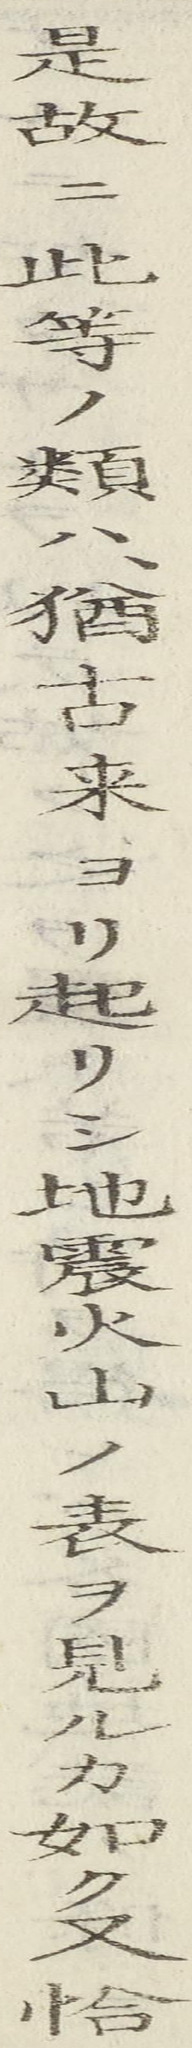是故ニ此等ノ類ハ、猶古来ヨリ起リシ地震火山ノ表ヲ見ルカ如ク又恰
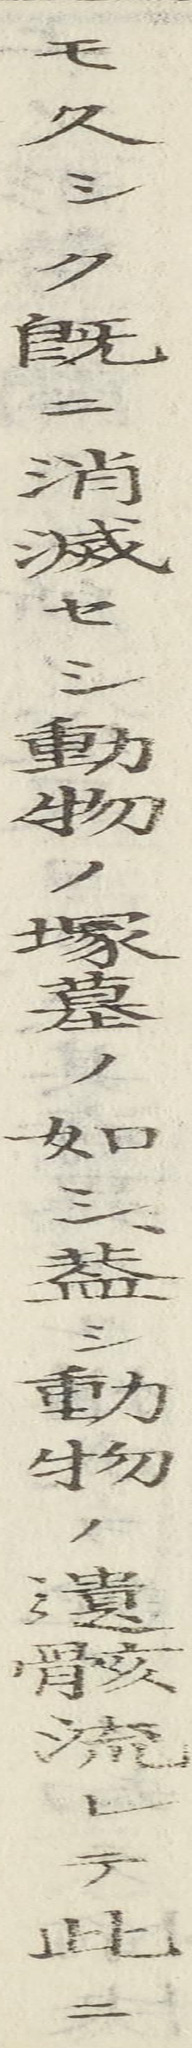モ久シク既ニ消滅セシ動物ノ塚墓ノ如シ、蓋シ動物ノ遺骸流レテ此ニ
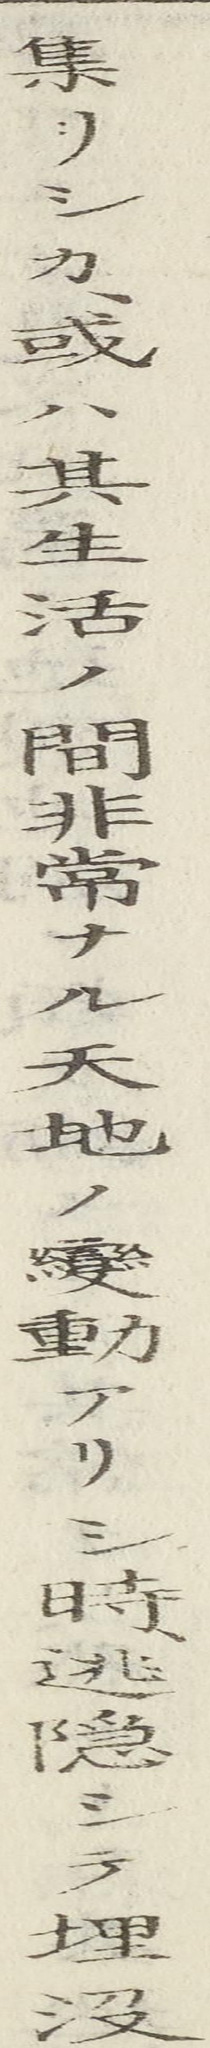集リシカ、或ハ其生活ノ間非常ナル天地ノ変動アリシ時、逃隠シテ埋没
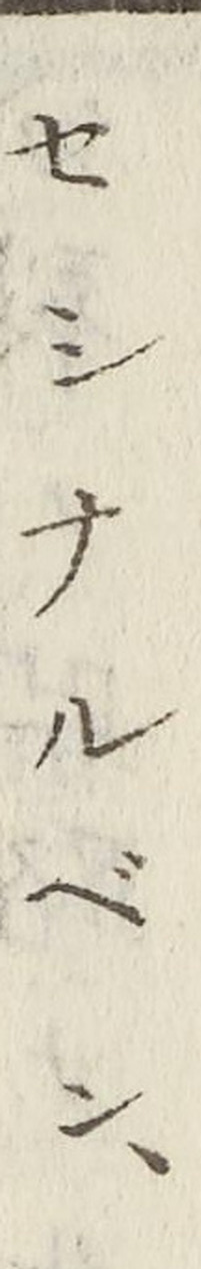セシナルベシ、
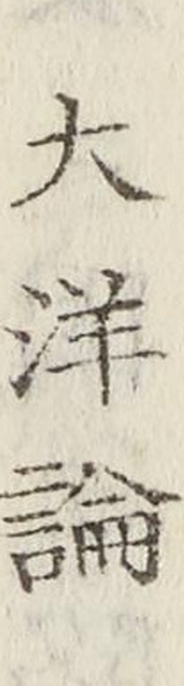大洋論
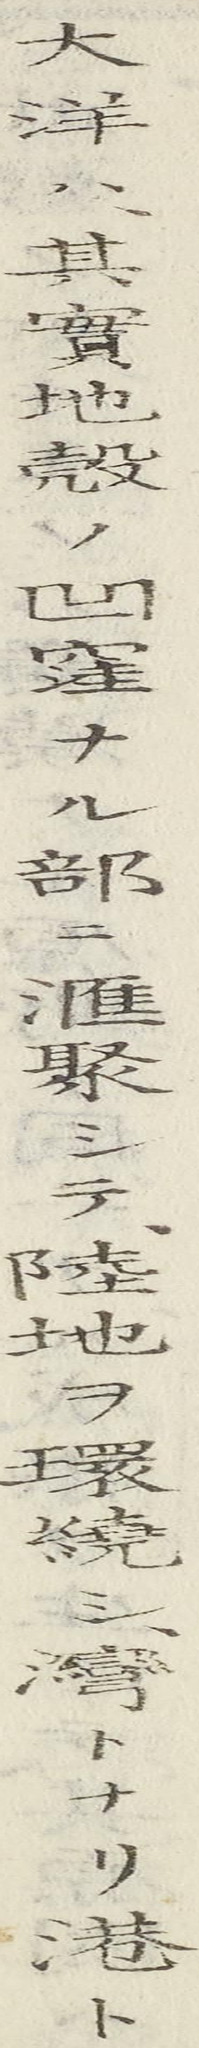大洋ハ、其実地殻ノ凹窪ナル部ニ匯聚シテ、陸地ヲ環繞シ、湾トナリ港ト
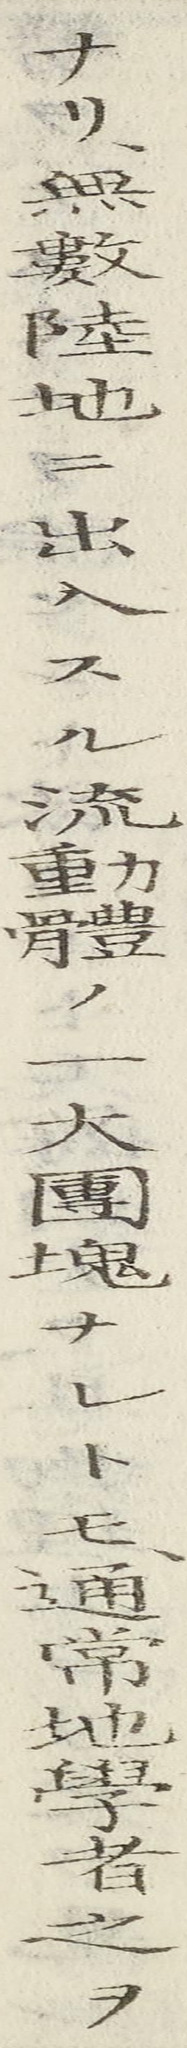ナリ、無数陸地ニ出入スル流動体ノ一大団塊ナレトモ、通常地学者之ヲ
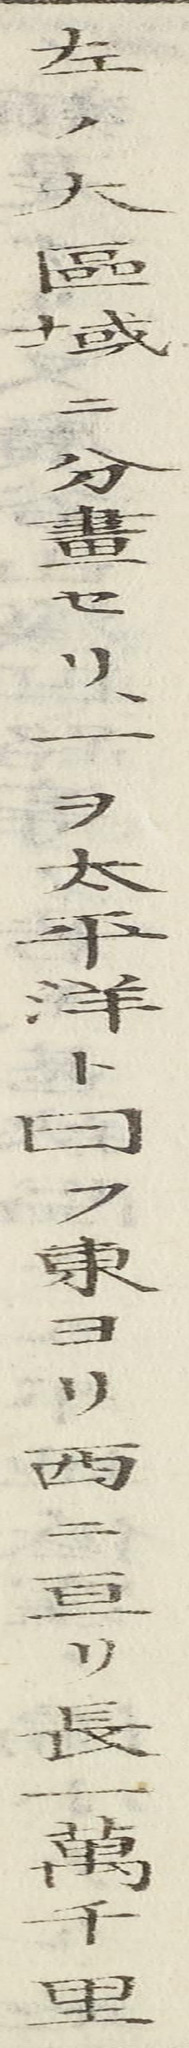左ノ大区域ニ分画セリ、一ヲ太平洋ト曰フ東ヨリ西ニ亘リ長一万千里
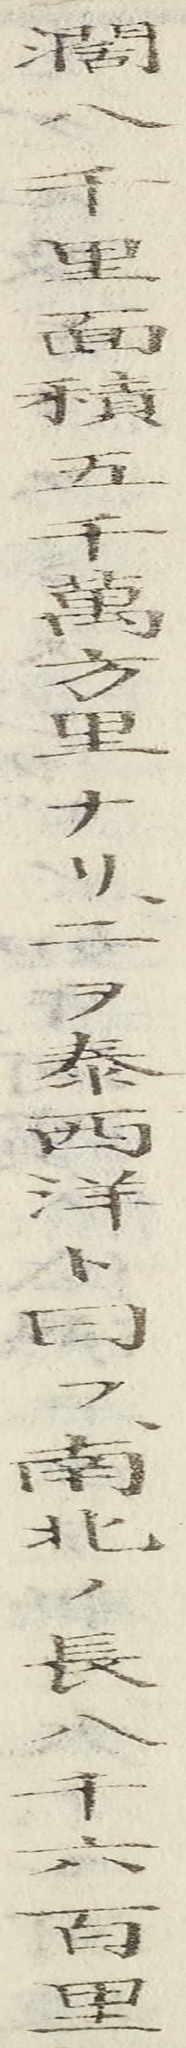濶八千里面積五千万方里ナリ、ニヲ泰西洋ト曰フ、南北ノ長八千六百里
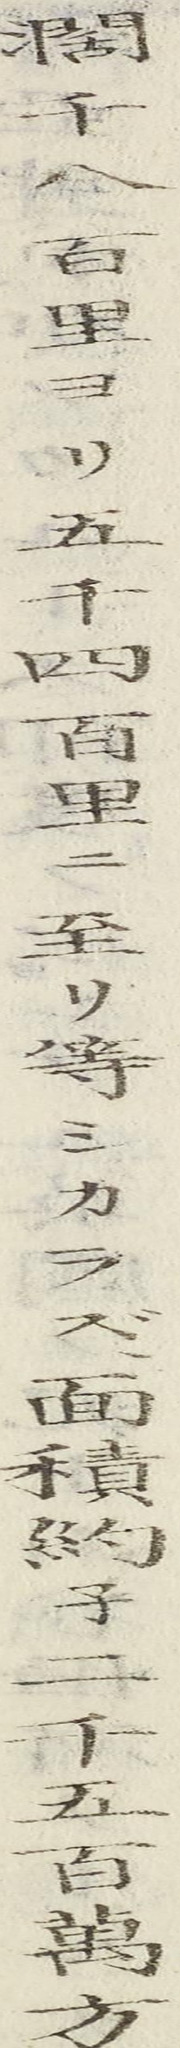濶千八百里ヨリ五千四百里ニ至リ等シカラズ、面積約ネ二千五百万方
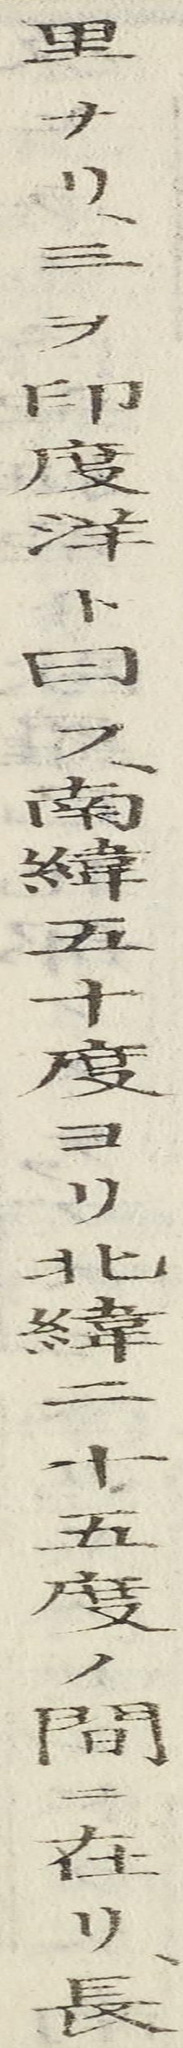里ナリ、三ヲ印度洋ト曰フ、南緯五十度ヨリ北緯二十五度ノ間ニ在リ、長
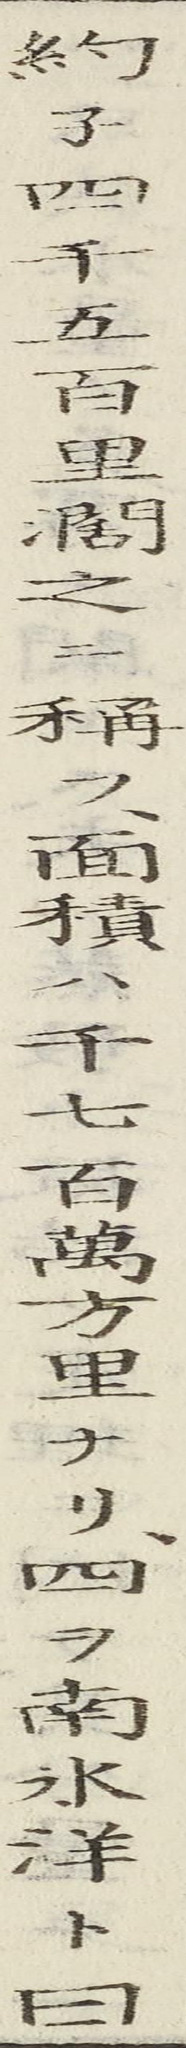約ネ四千五百里濶之ニ称フ、面積ハ千七百万方里ナリ、四ヲ南氷洋ト曰
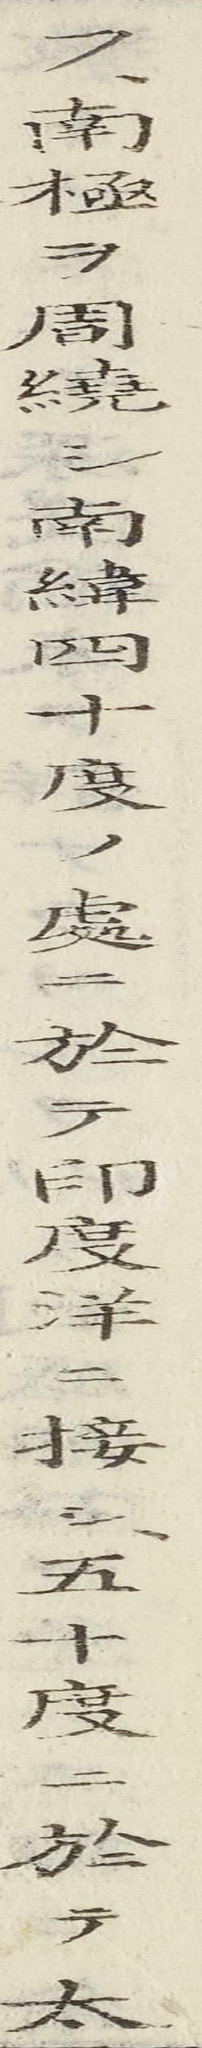フ、南極ヲ周繞シ南緯四十度ノ処ニ於テ印度洋ニ接シ、五十度ニ於テ太
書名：百科全書　地文學　全
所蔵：東京大学地震研究所図書室 Earthquake Research Institute Library, The University of Tokyo, JAPAN
